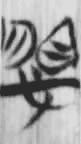○（閉）
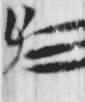於
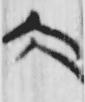大
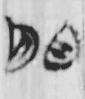門
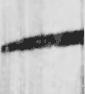一
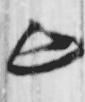白
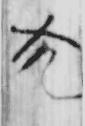犬
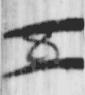五
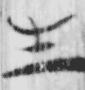生
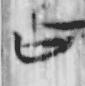占
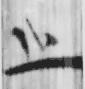之
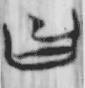曰
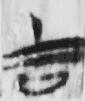吉
